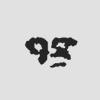祭
